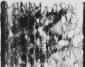冬（冬）
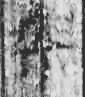○（夕）
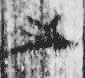之
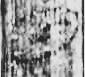月
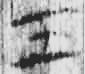壬
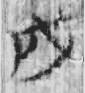戌
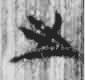之
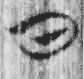日
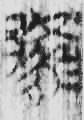○（羅）
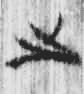之
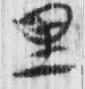里
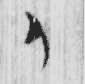人
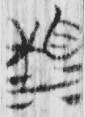湘
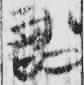訟
